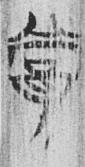賞
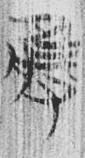○（獲）
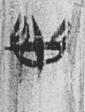○（葸）
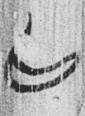㠯（以）
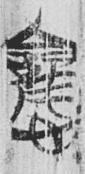懽（勸）
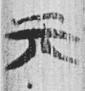亓
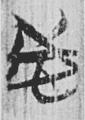志
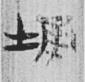{土甬}（勇）
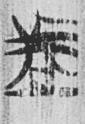者
